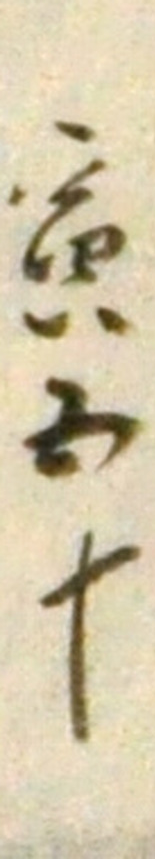寅五十
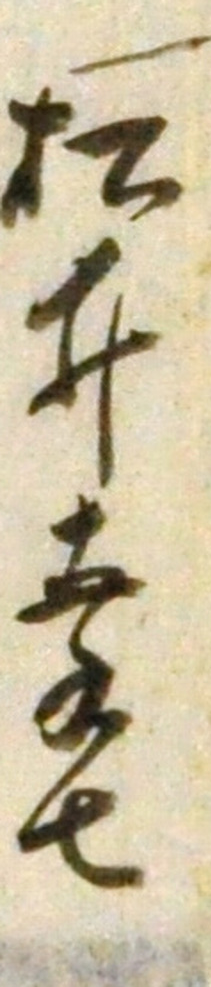松井幸七
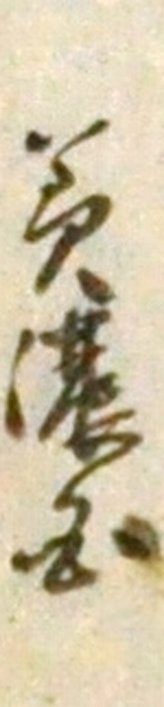美濃国
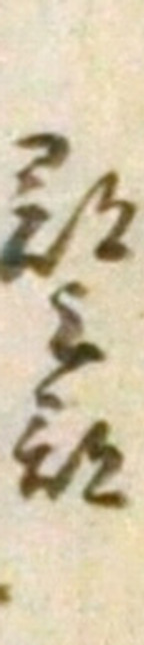郡上郡
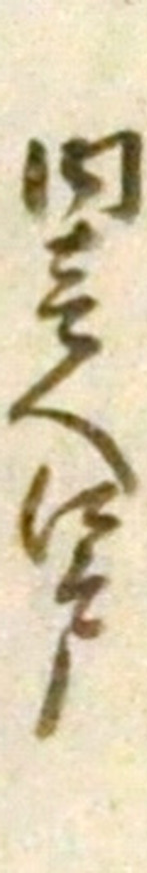内壱人江戸
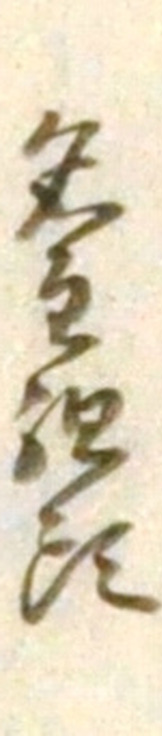名主組頭
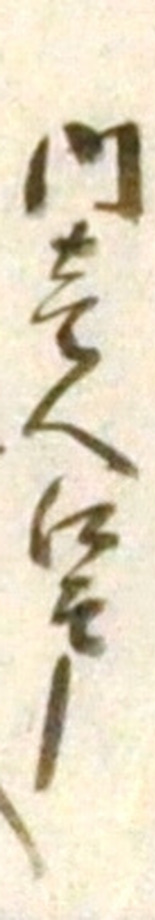内壱人江戸
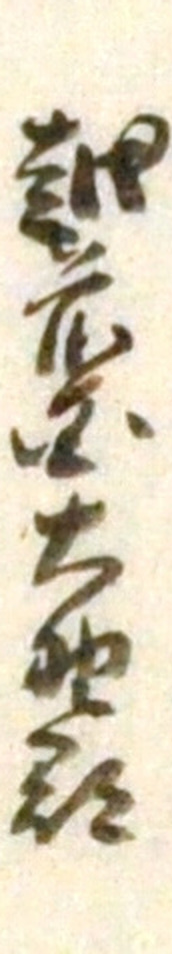越前国大野郡
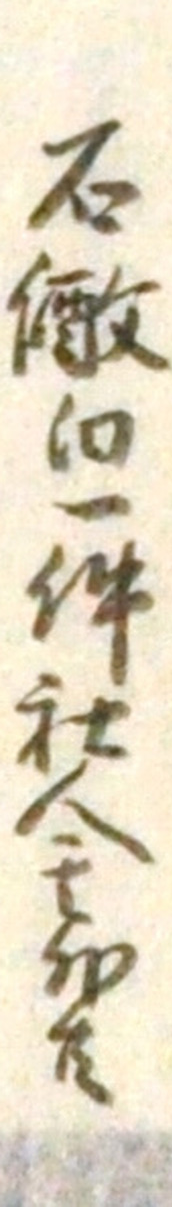石徹白一件社人其外共
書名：罪状判決
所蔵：伊那市立高遠町図書館・合同会社AMANE
